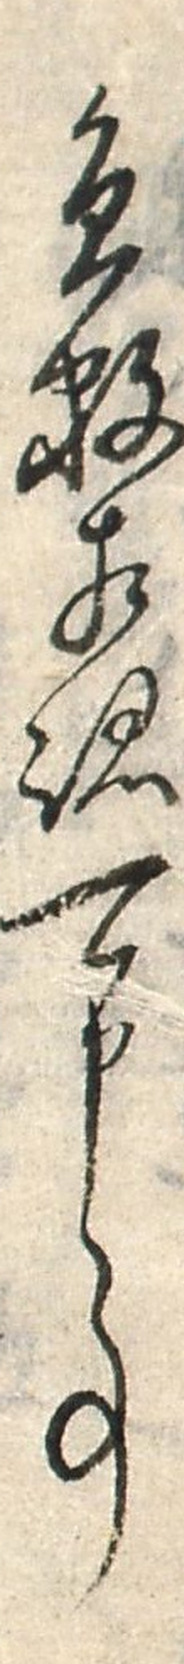員数相認可申事
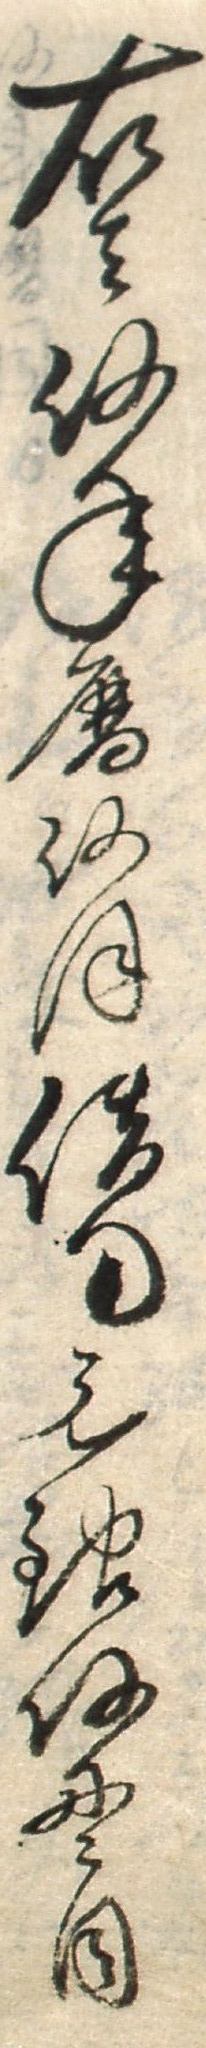右は何年暦何月借用元銀何貫目
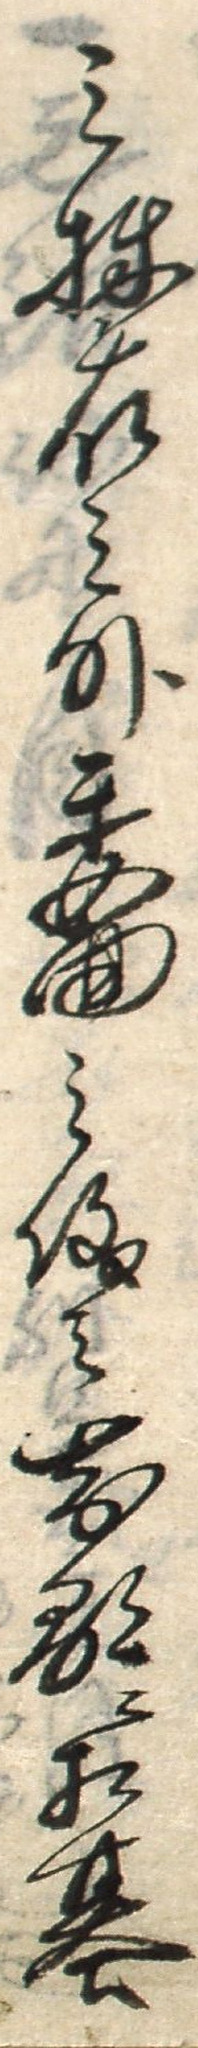之株右之外委曲之儀は前顕に相基

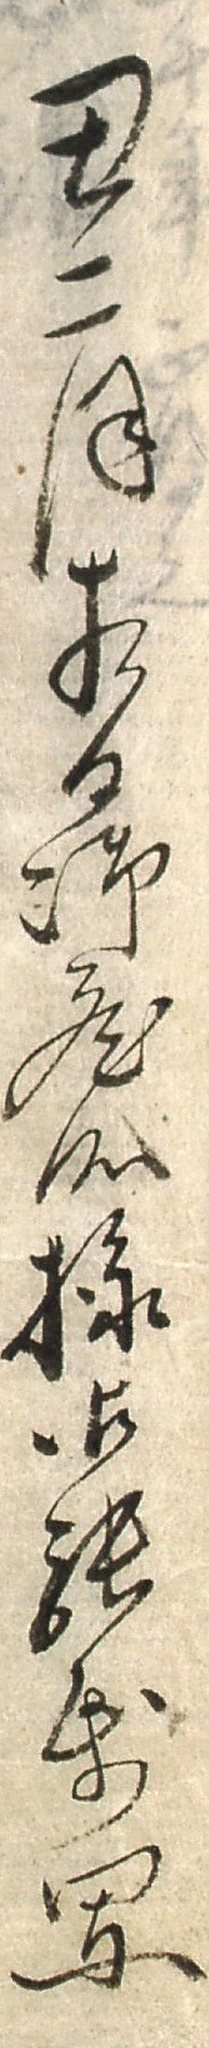丑二月十九日御蔵処様御張紙写
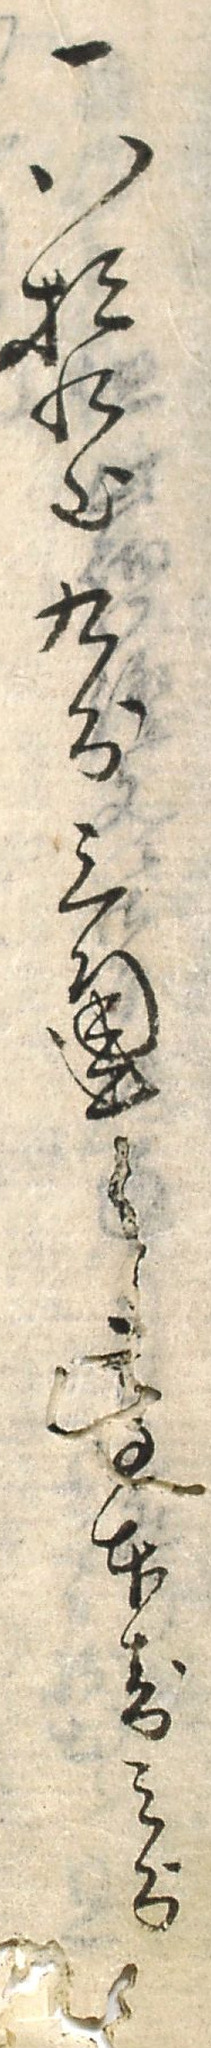一八拾九匁九分三厘本封之分
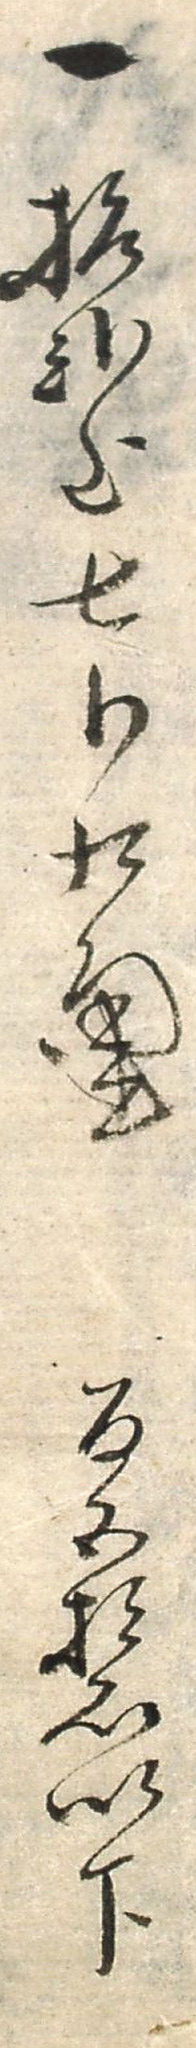一拾弐匁七分九厘百五拾石以下
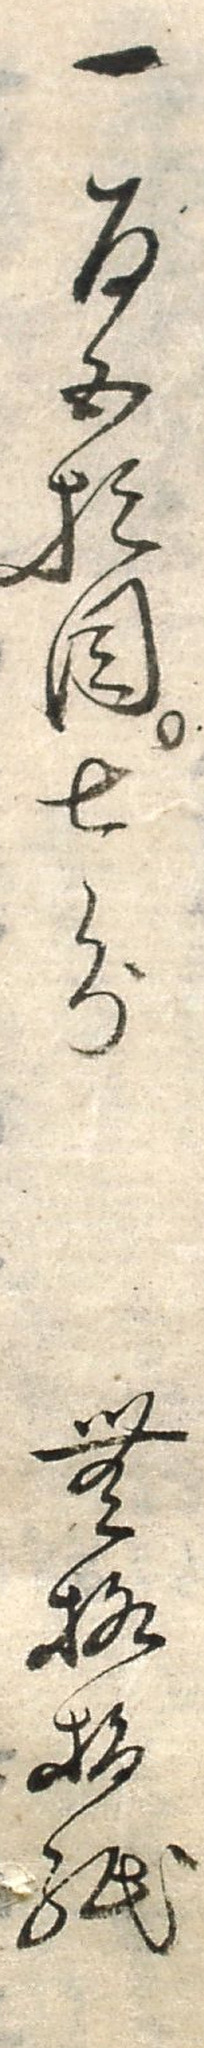一百五拾目。七分無格指紙
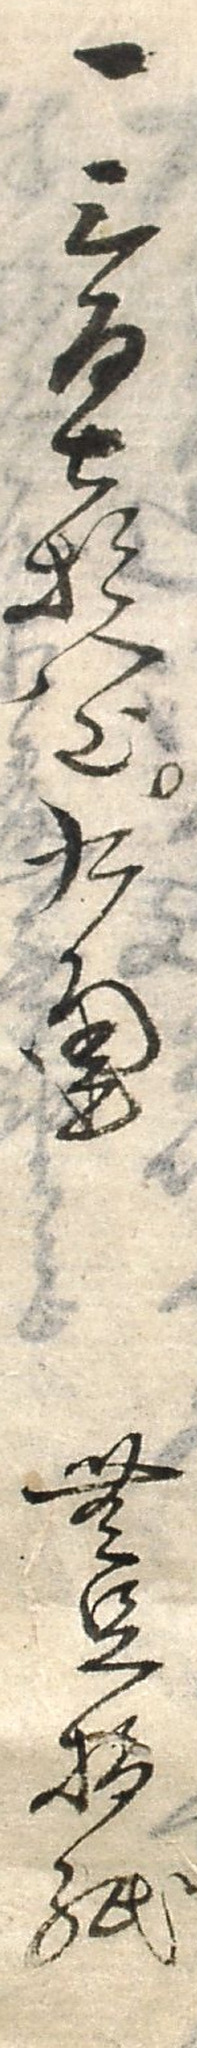一三百七拾八匁。九厘無足指紙
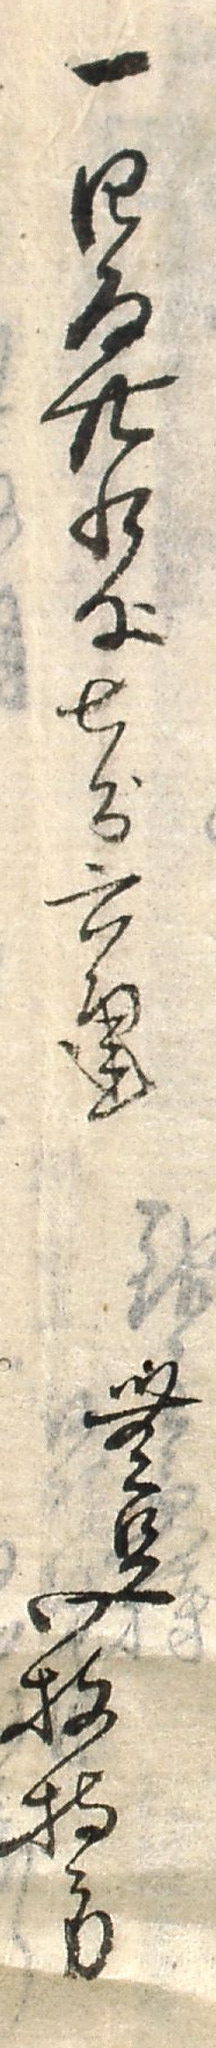一四百廿九匁七分六厘無足御扶持方
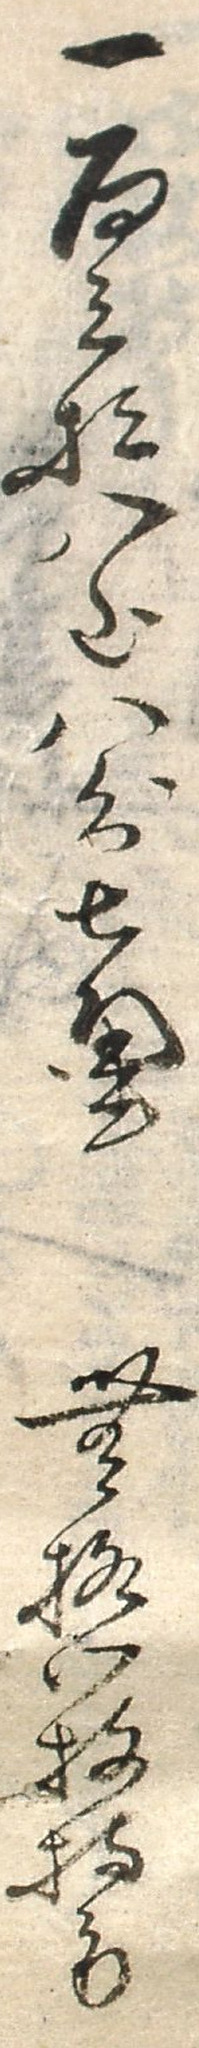一百三拾八匁八分七厘無格御扶持方
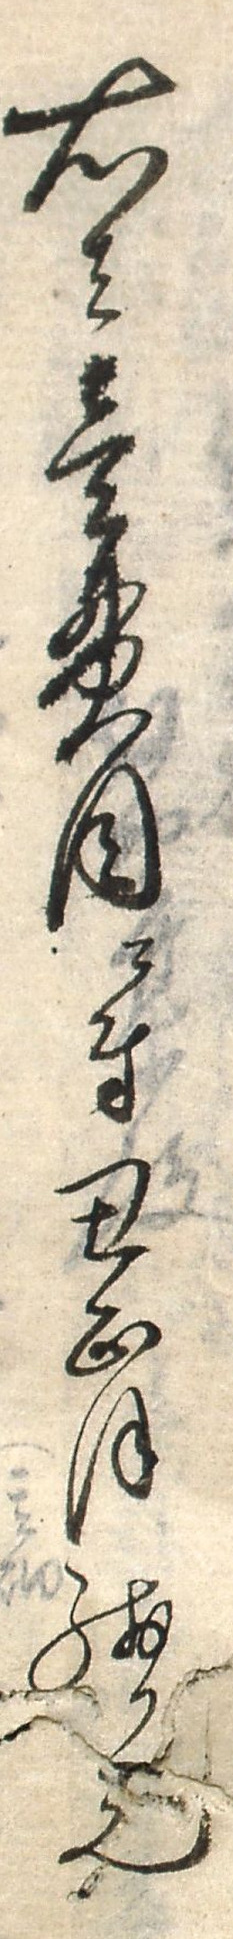右は壱貫目に付丑正月残り也
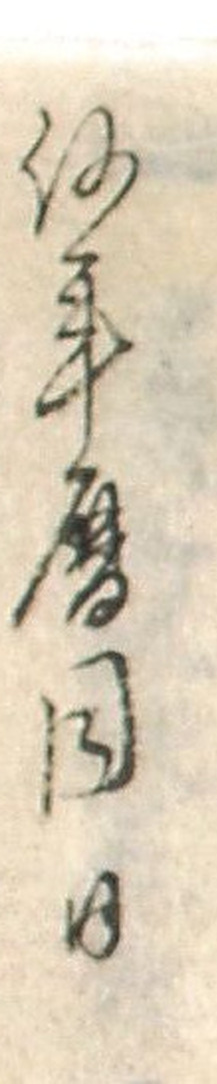何年暦月日
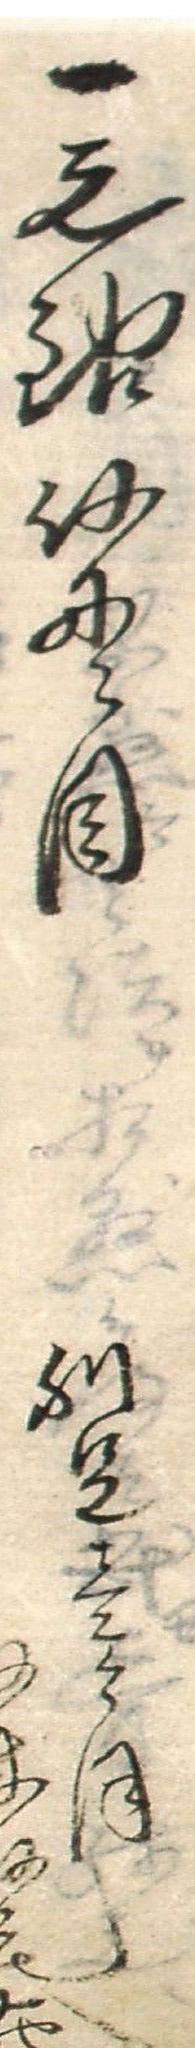一元銀何貫目利足壱ヶ月
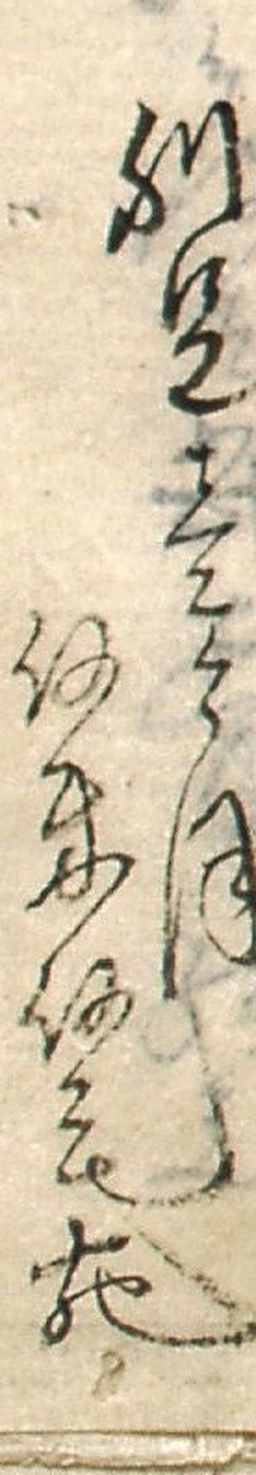何朱何毛宛
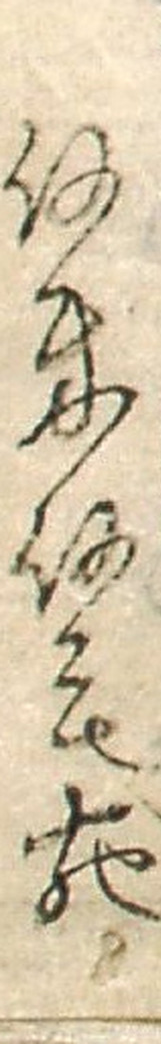何朱何毛宛
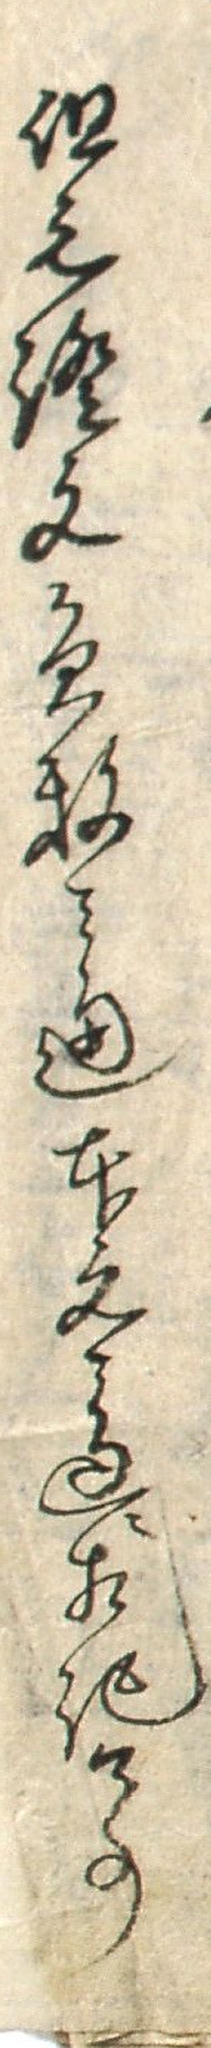但元証文員数之通本文之通に相記候事
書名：御家中并無格御奉公人借銀御仕解一件御書付写其余共控
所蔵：鳴門教育大学 Naruto University of Education
